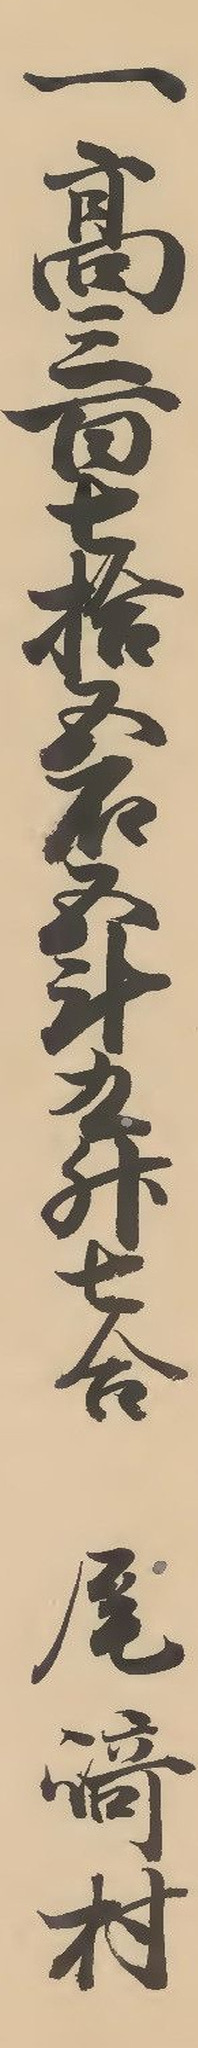一髙三百七拾五石五斗九升七合尾崎村
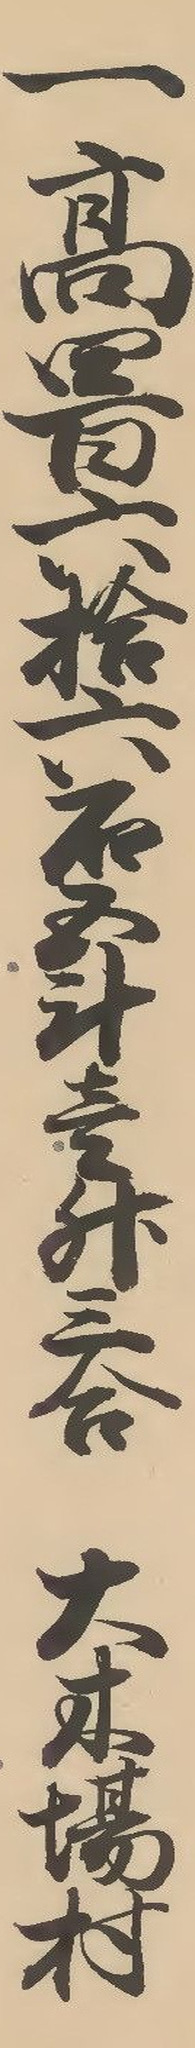一髙四百六拾六石五斗壱升三合大木場村
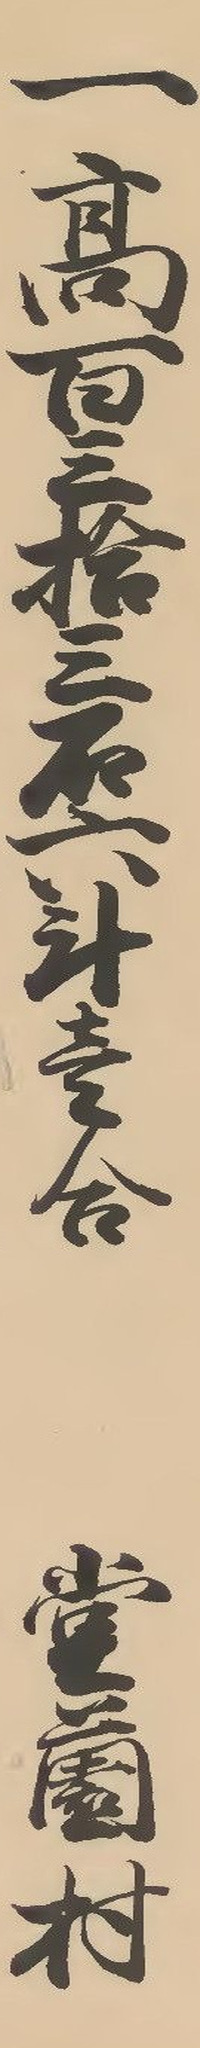一髙百三拾三石六斗壱合堂村
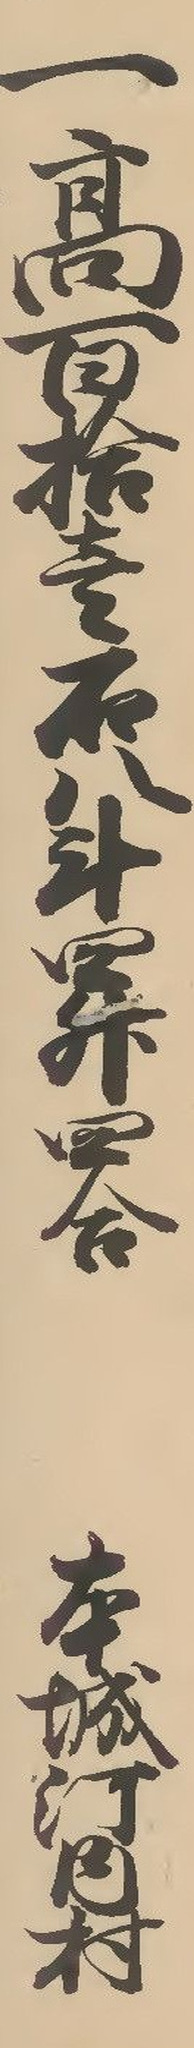一髙百拾壱石八斗四升四合本城河内村
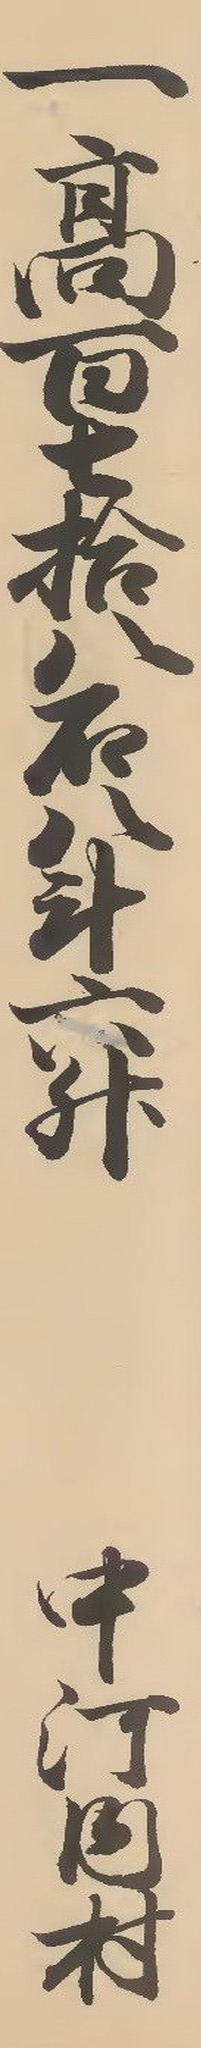一髙百七拾八石八斗六升中河内村
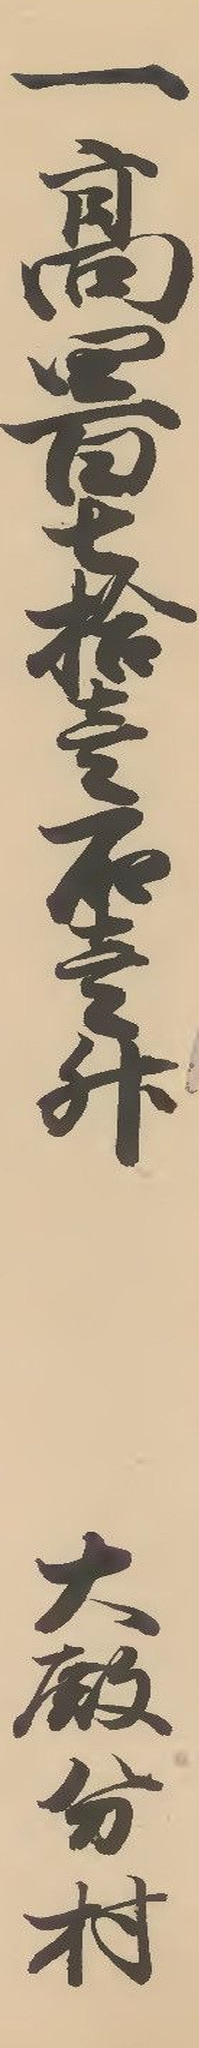一髙四百七拾壱石壱升大殿分村
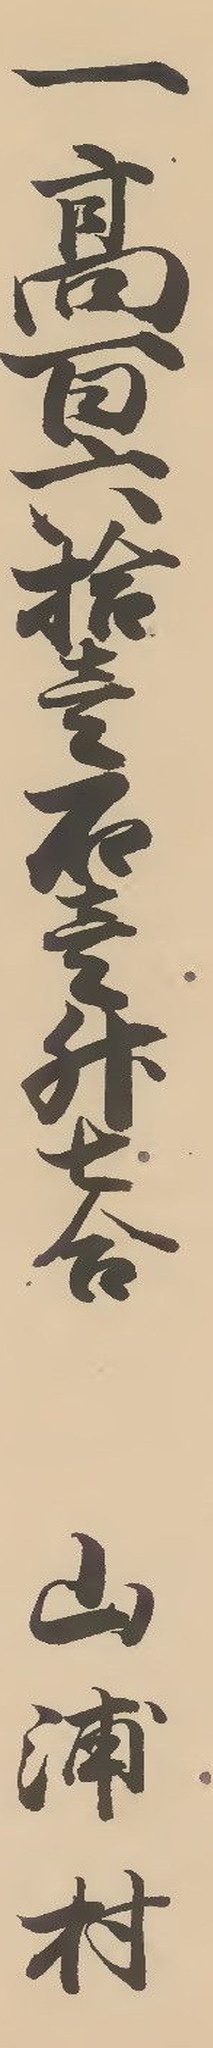一髙百六拾壱石壱升七合山浦村
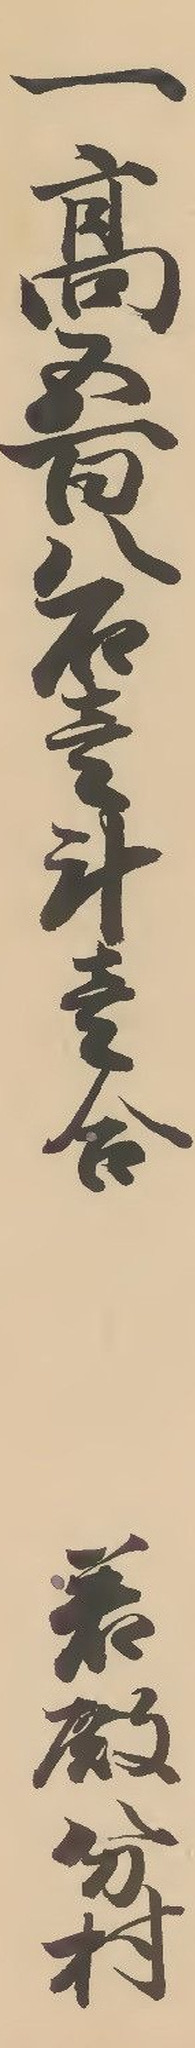一髙五百八石壱斗壱合若殿分村

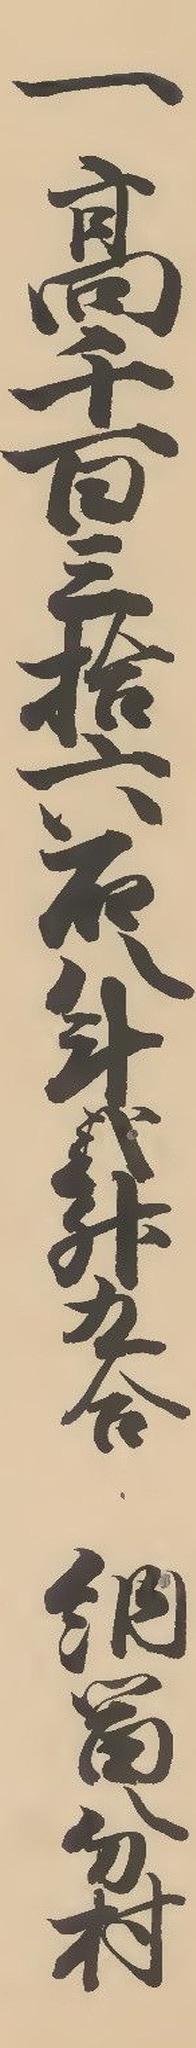一髙千百三拾六石八斗弐升九合納冨分村
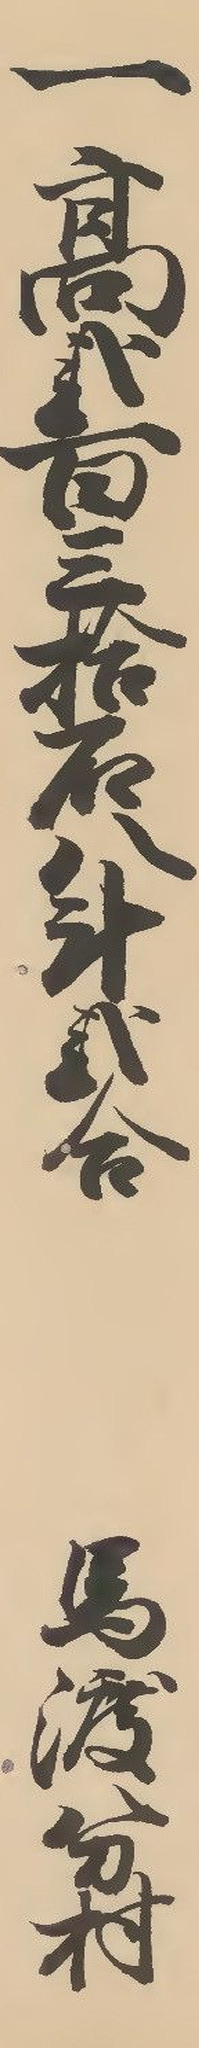一髙弐百三拾石八斗弐合馬渡分村
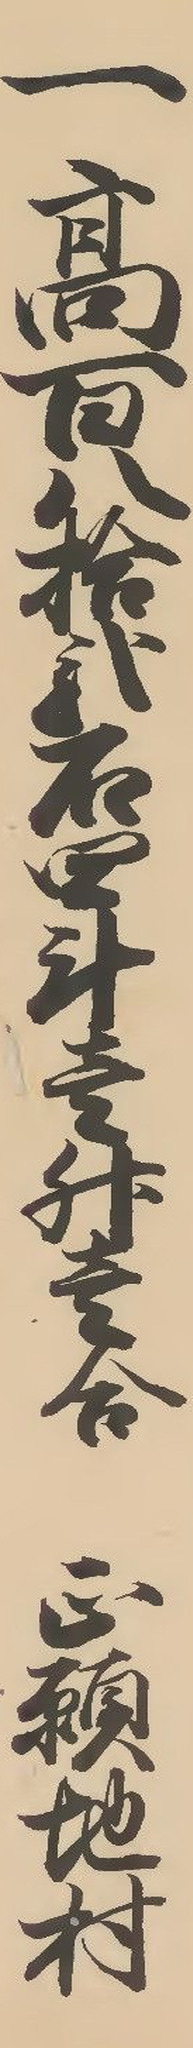一髙百八拾弐石四斗壱升壱合正願地村
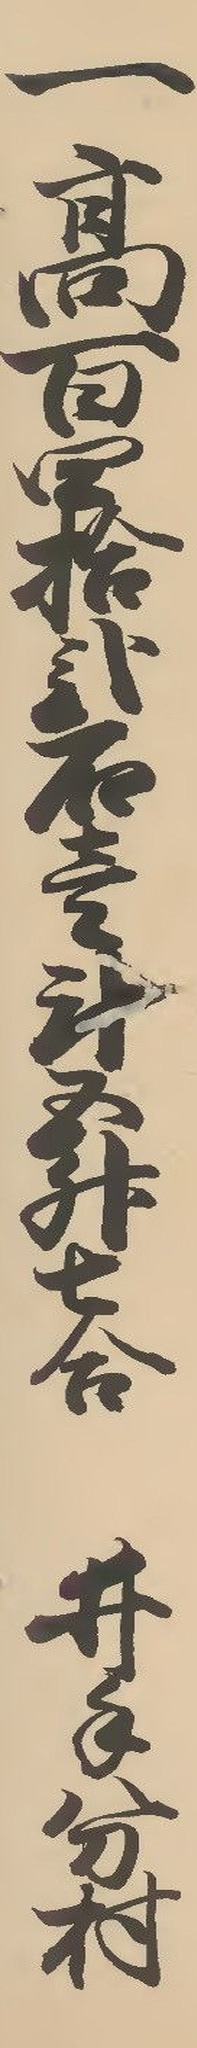一髙百四拾弐石壱斗五升七合井手分村
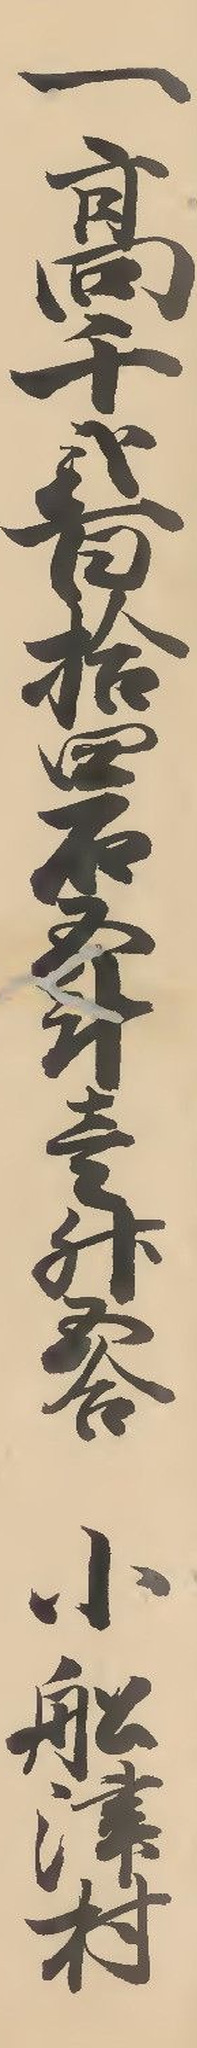一髙千弐百拾四石五斗壱升五合小舩津村
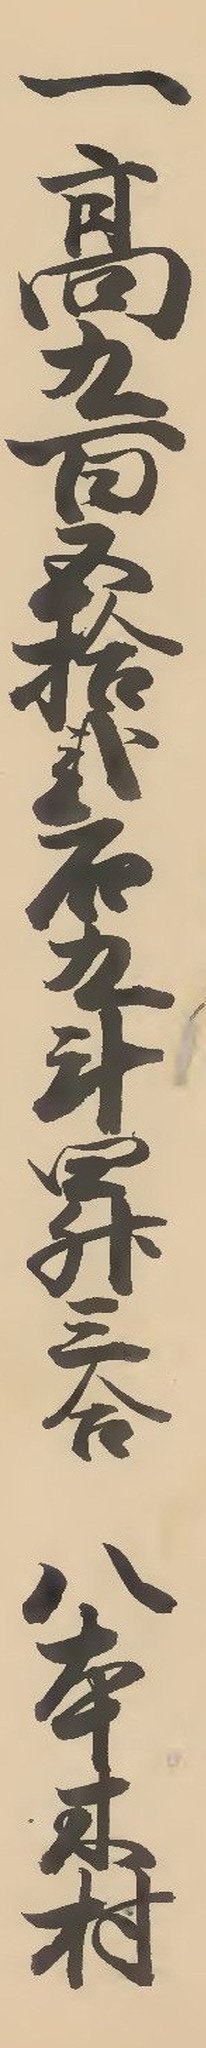一髙九百五拾弐石九斗四升三合八本木村
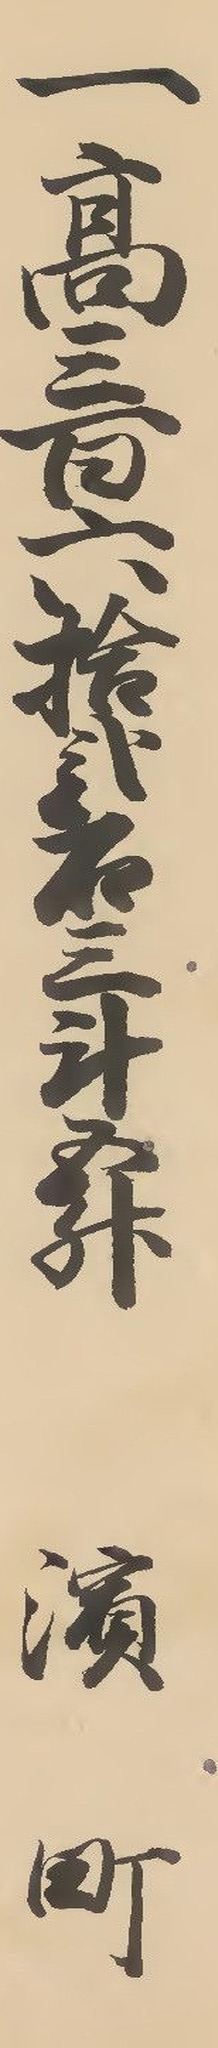一髙三百六拾弐石三斗五升濱町
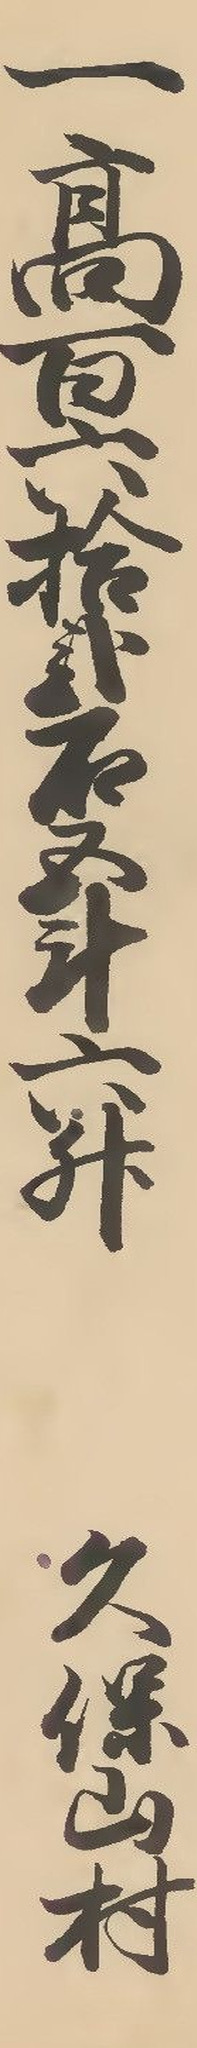一髙百六拾弐石五斗六升久保山村
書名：肥前国郷帳
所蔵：国立公文書館 National Archives of Japan
